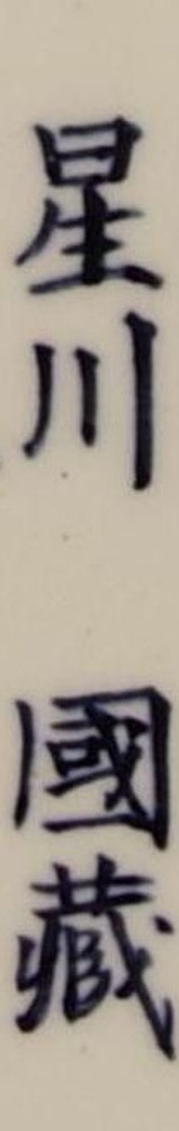星川國蔵
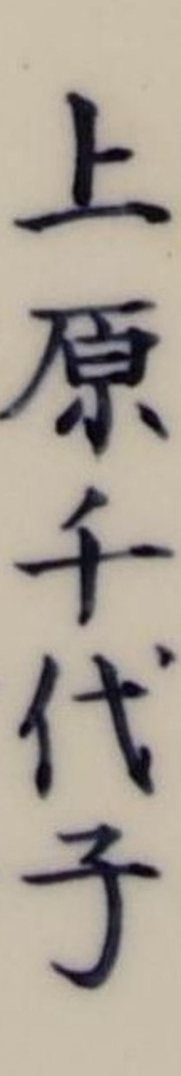上原千代子
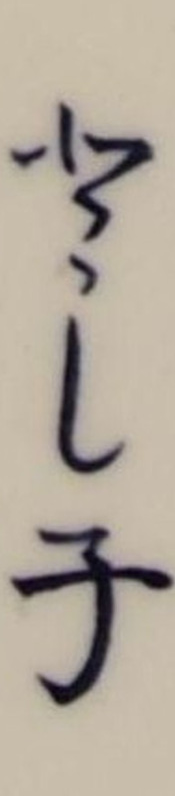とし子
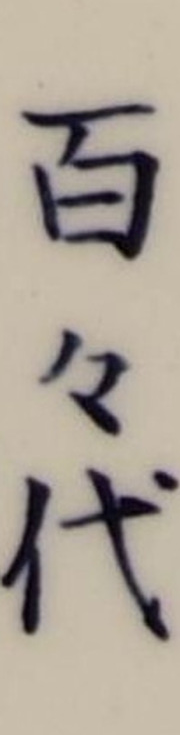百々代
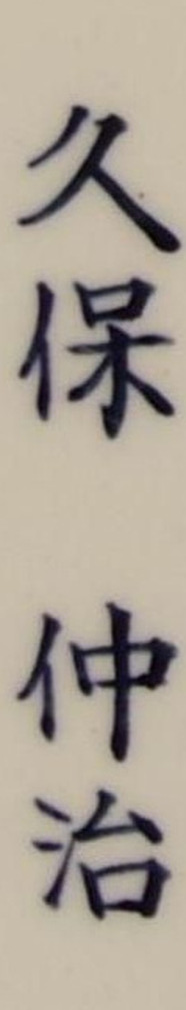久保仲治
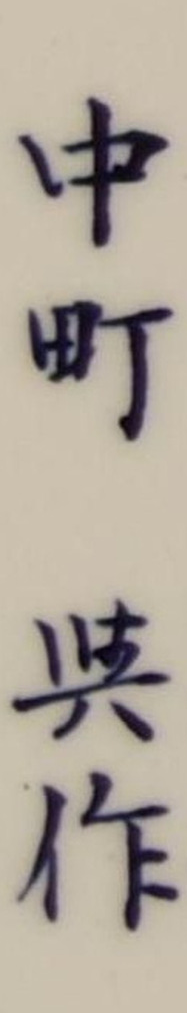中町与作

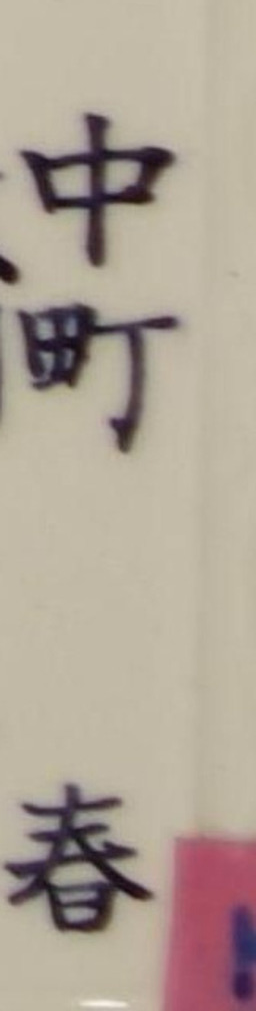中町春
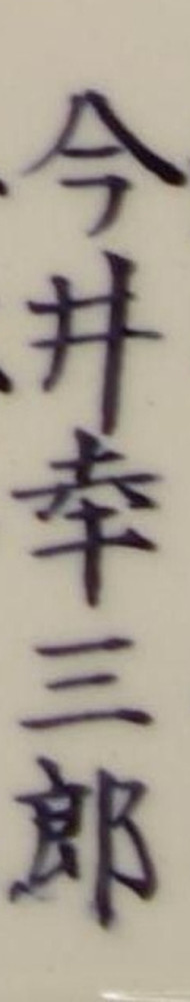今井幸三郎
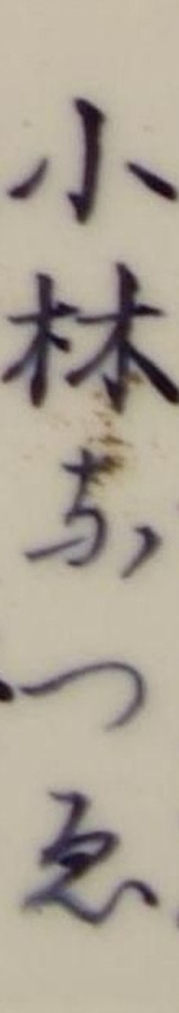小林なつゑ
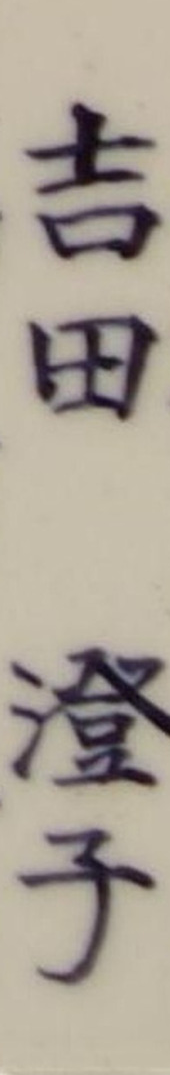吉田澄子
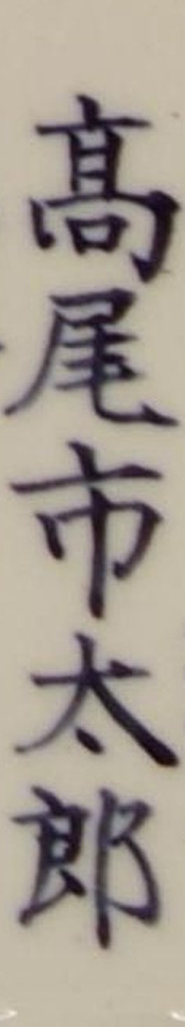高尾市太郎
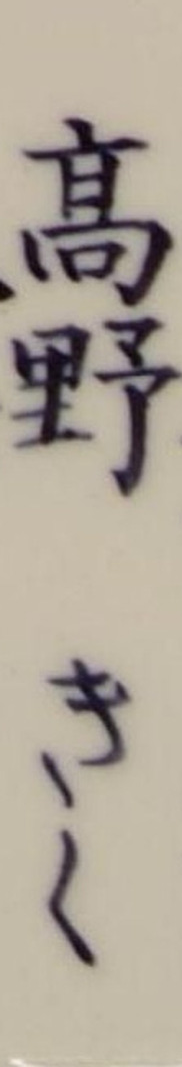高野きく
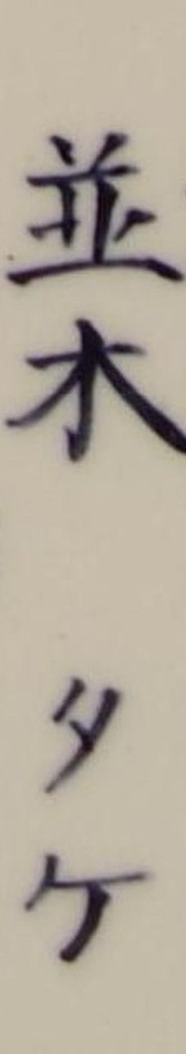並木タケ
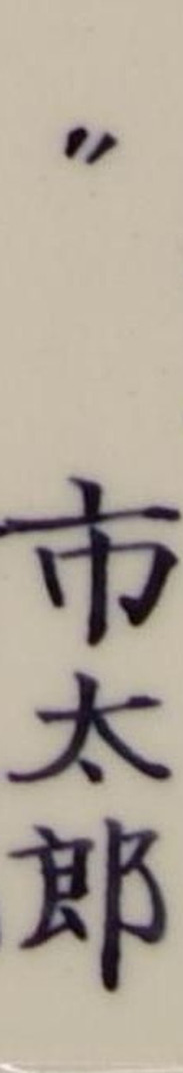市太郎
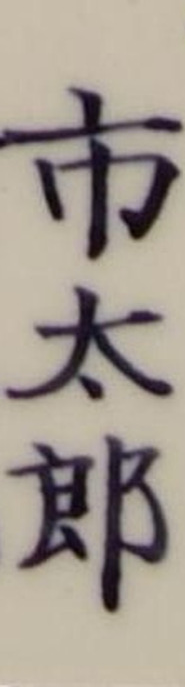市太郎
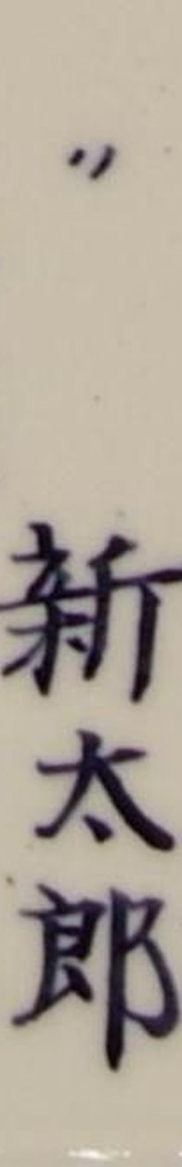新太郎
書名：E~L
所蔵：高野山金剛峯寺
